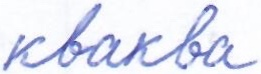кваква
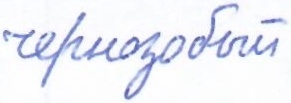чернозобый
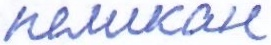пеликан
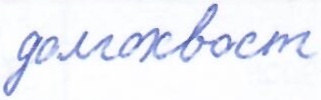долгохвост
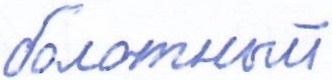болотный
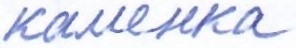каменка
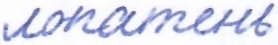лопатень
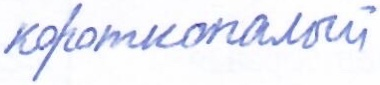короткопалый
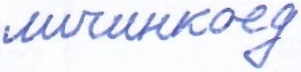личинкоед
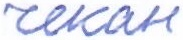чекан
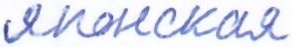японская
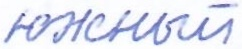южный
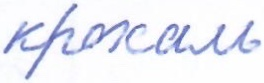крохаль
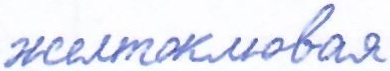желтоклювая
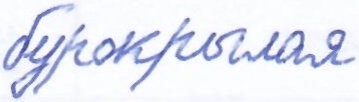бурокрылая
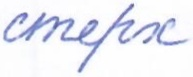стерх
